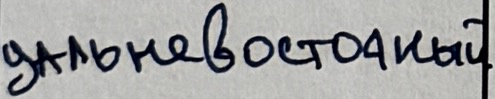дальневосточный
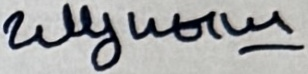глупыш
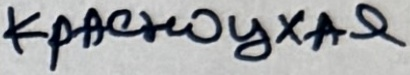красноухая
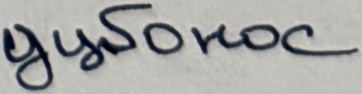дубонос
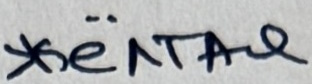жёлтая
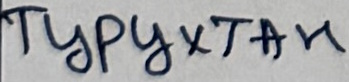турухтан
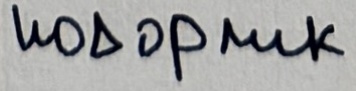подорлик
